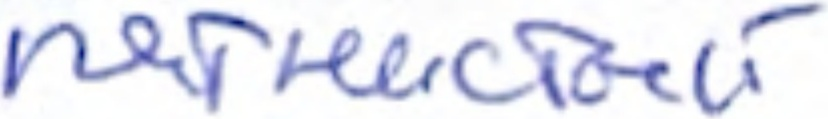пятнистый
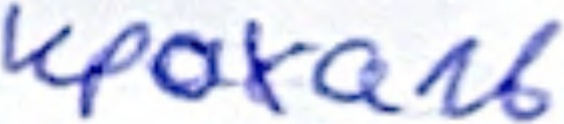крохаль
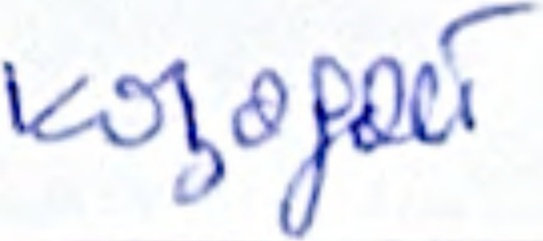козодой
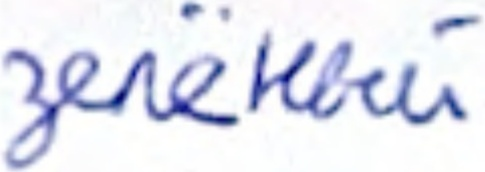зелёный
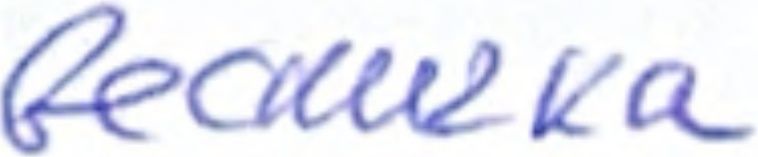весничка
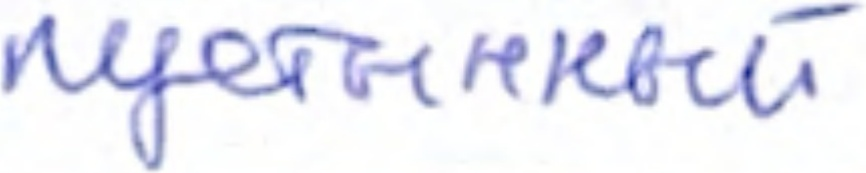пустынный
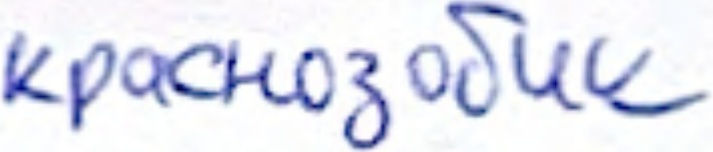краснозобик
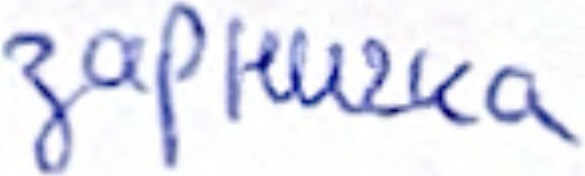зарничка
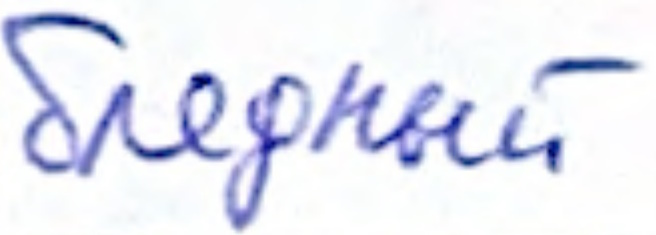бледный
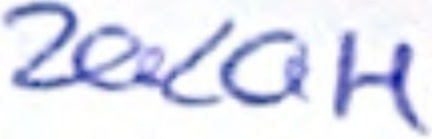чекан
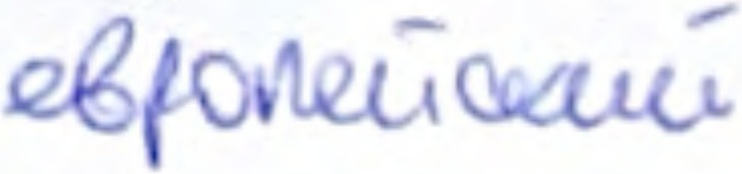европейский
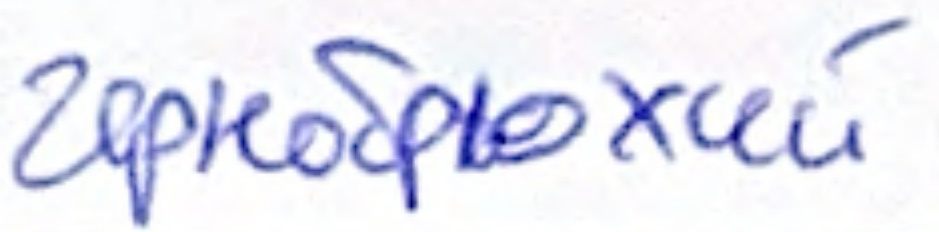чернобрюхий
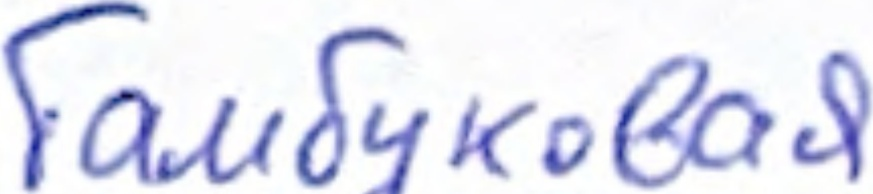бамбуковая
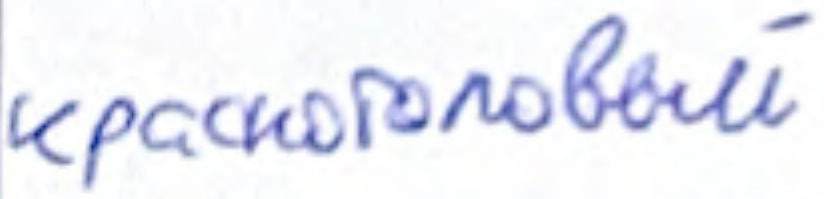красноголовый
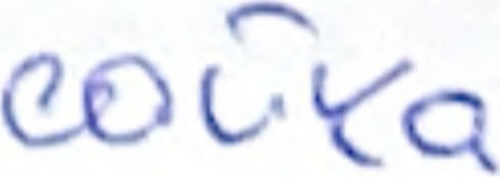сойка
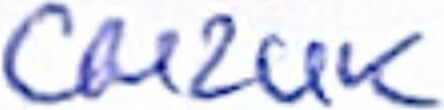сычик
